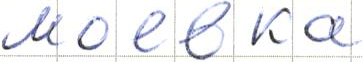моевка
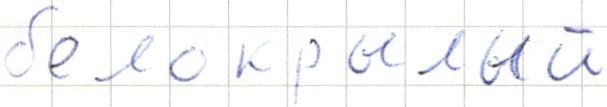белокрылый
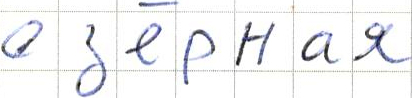озёрная
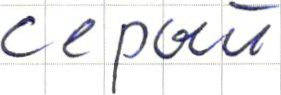серый
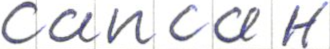сапсан
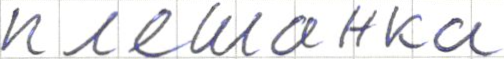плешанка
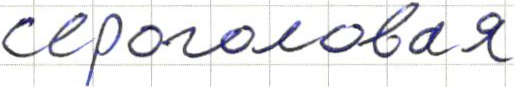сероголовая
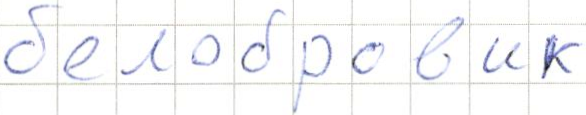белобровик
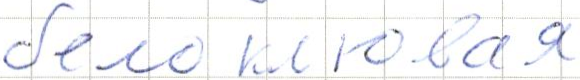белоклювая
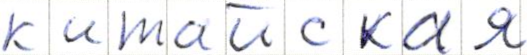китайская
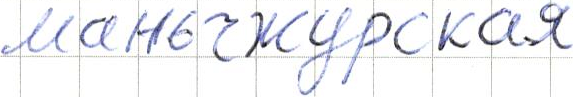маньчжурская
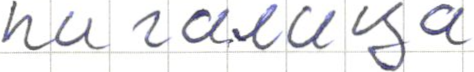пигалица
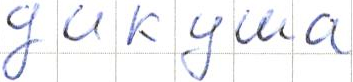дикуша
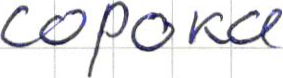сорока
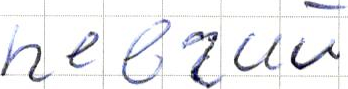певчий
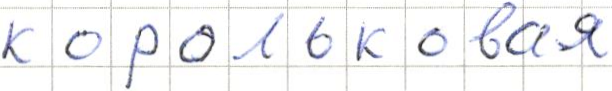корольковая
